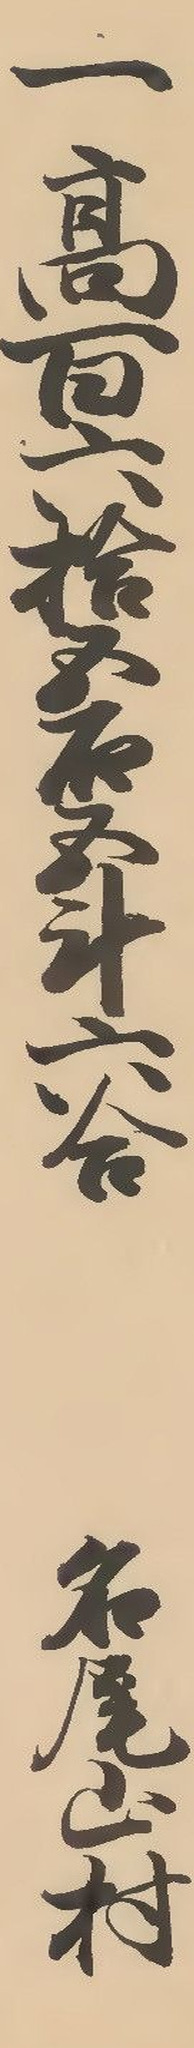一髙百六拾五石五斗六合名尾山村
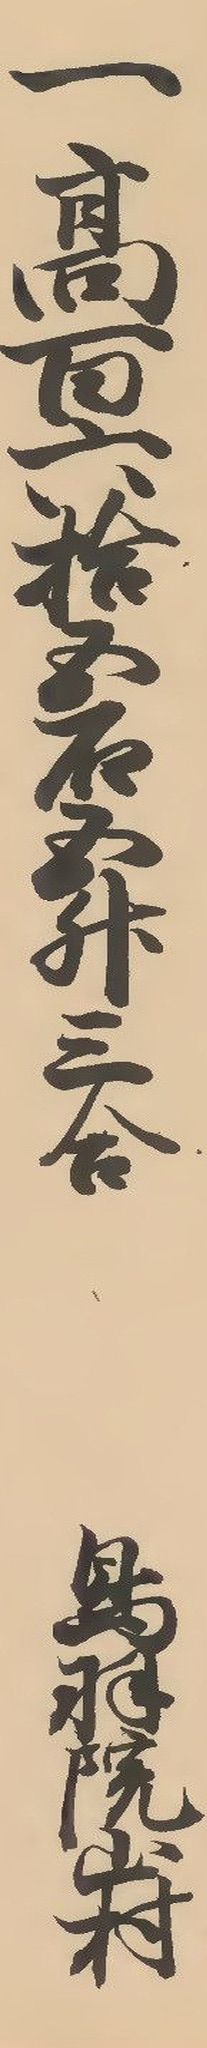一髙百六拾五石五升三合鳥羽院山村
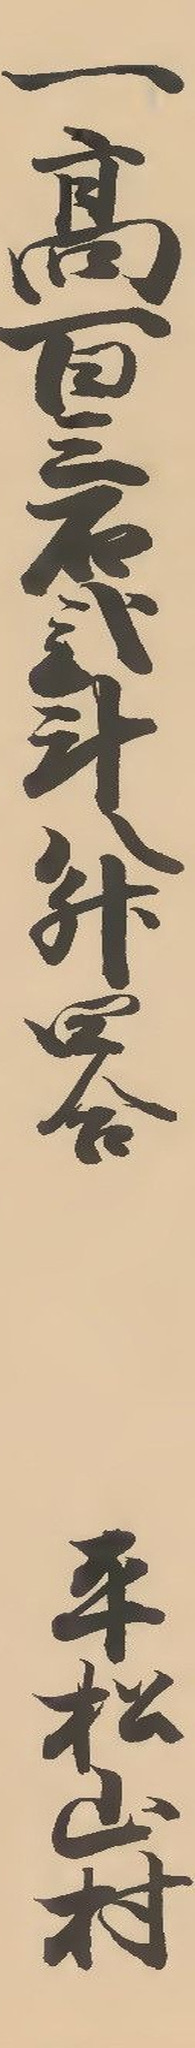一髙百三石弐斗八升四合平松山村
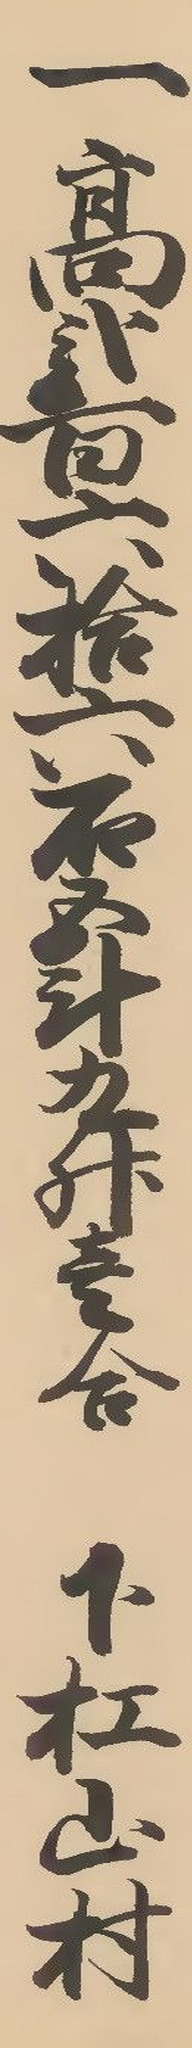一髙弐百六拾六石五斗九升壱合下江山村
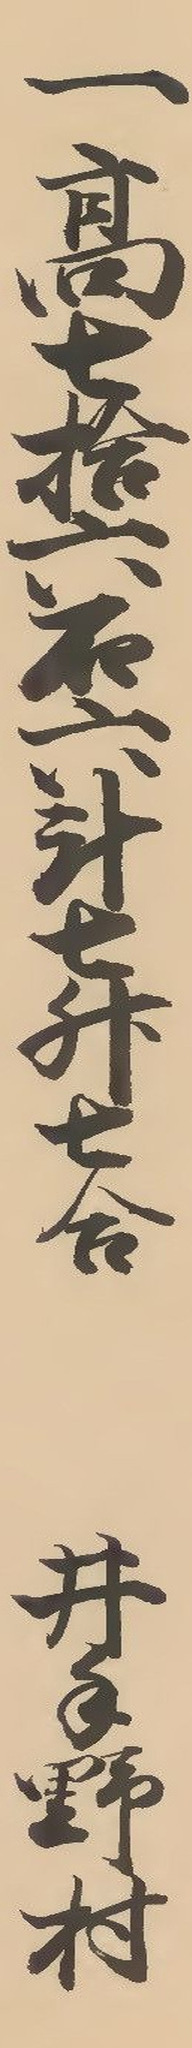一髙七拾六石六斗七升七合井手野村
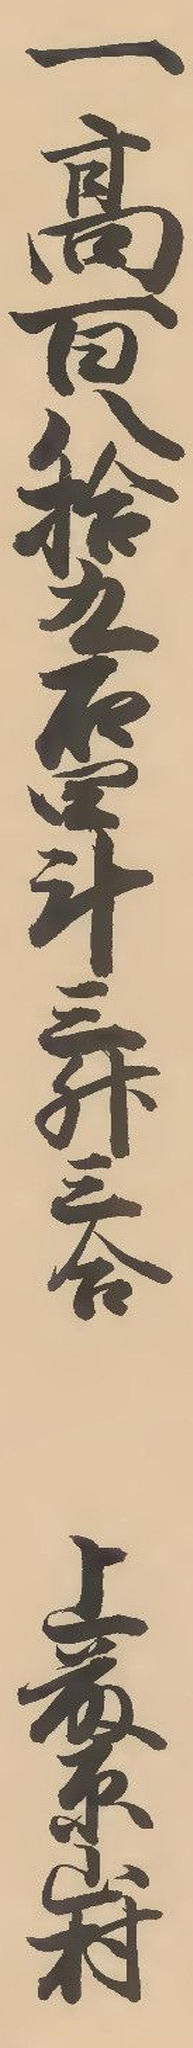一髙百八拾九石四斗三升三合上藤原山村

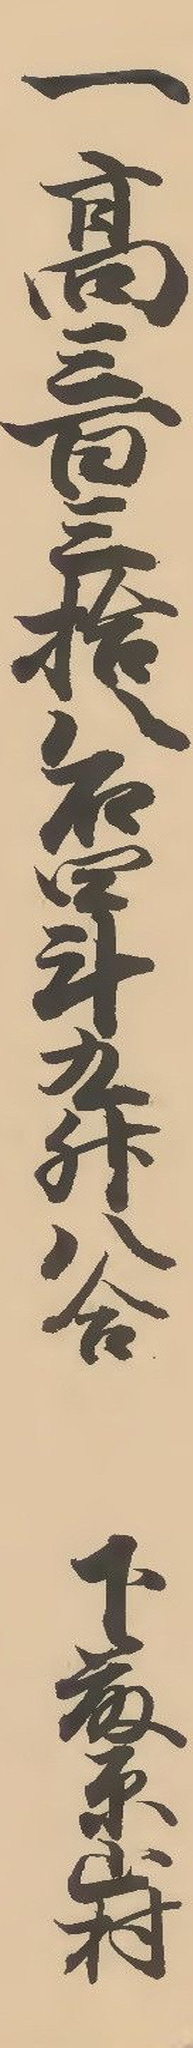一髙三百三拾八石四斗九升八合下藤原山村
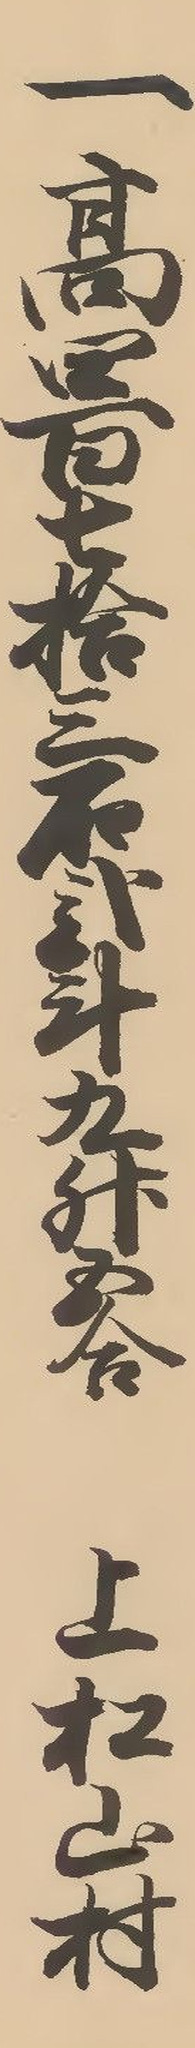一髙四百七拾三石弐斗九升五合上松山村
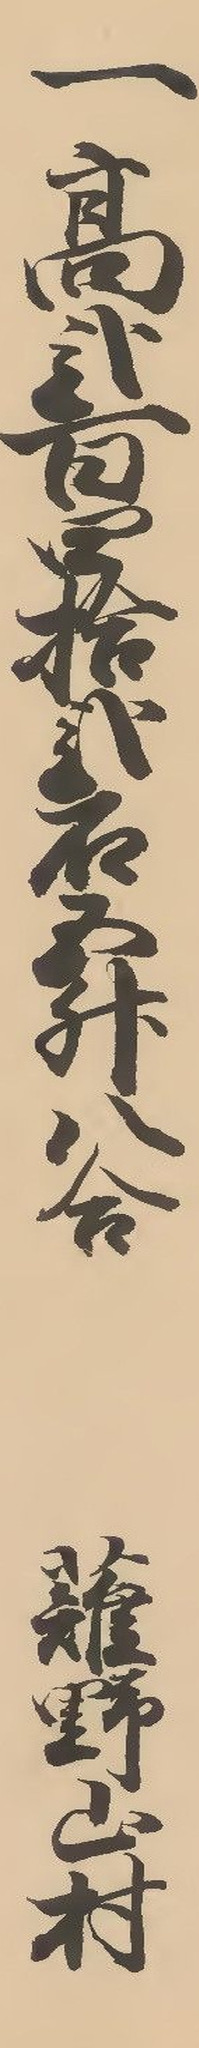一髙弐百四拾弐石五斗八合野山村
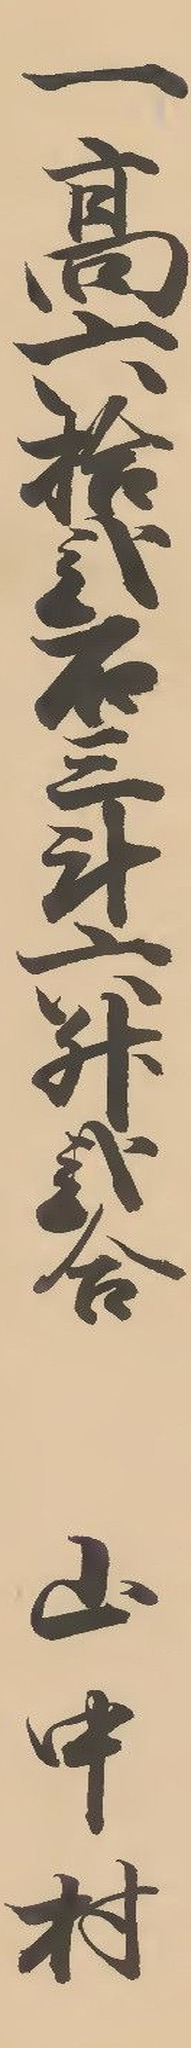一髙六拾弐石三斗六升弐合山中村
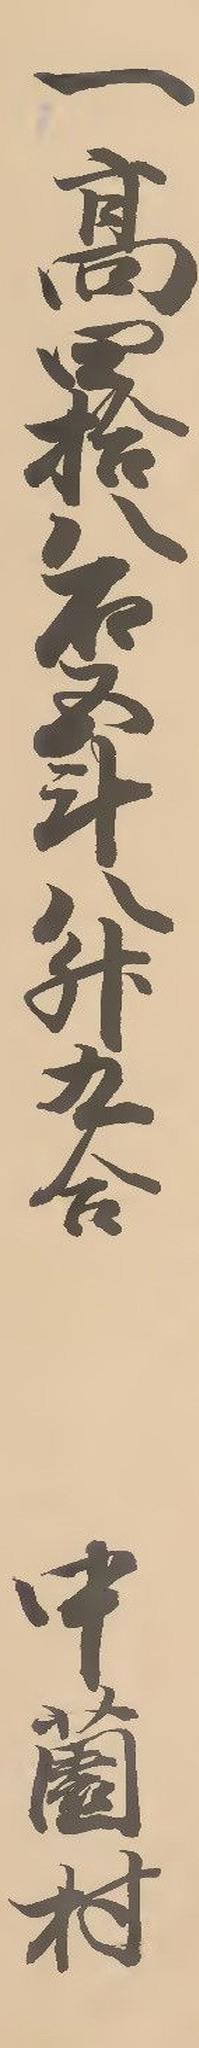一髙四拾八石五斗八升九合中薗村
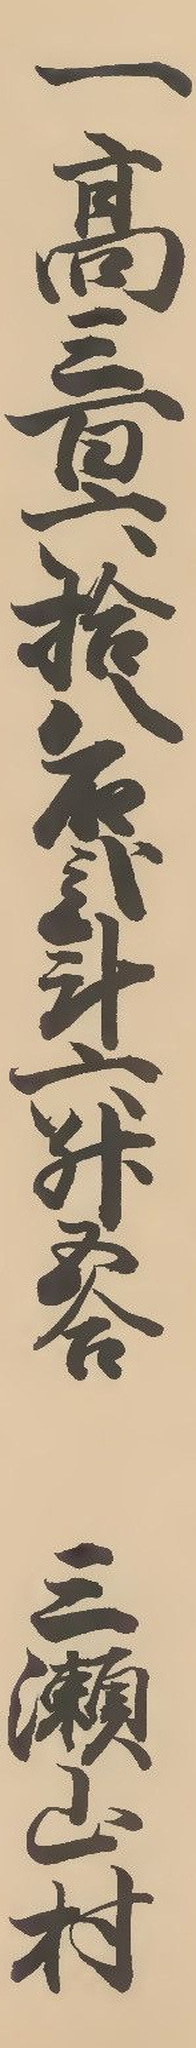一髙三百六拾八石弐斗六升五合三瀬山村
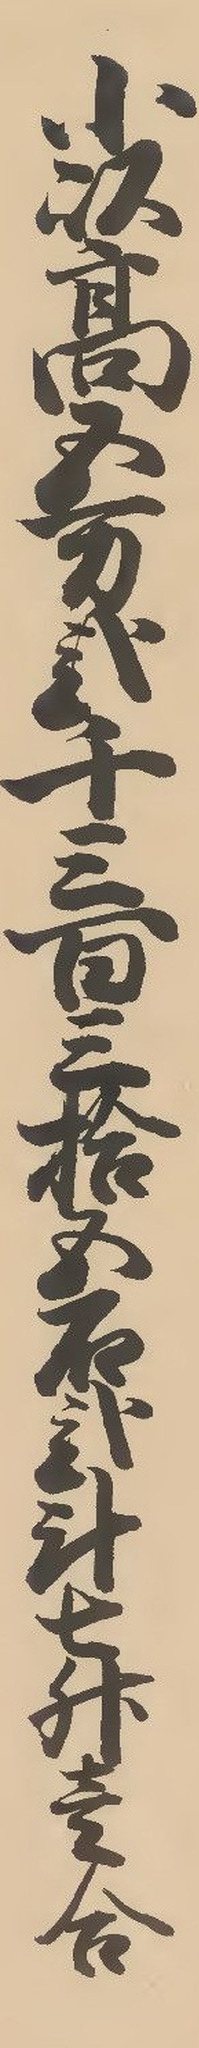小以髙五万弐千三百三拾五石弐斗七升壱合

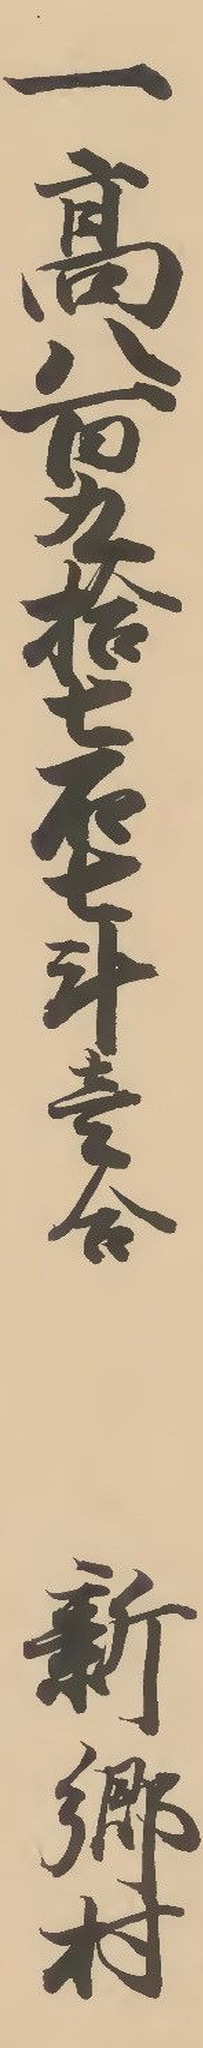一髙八百九拾七石七斗壱合新郷村
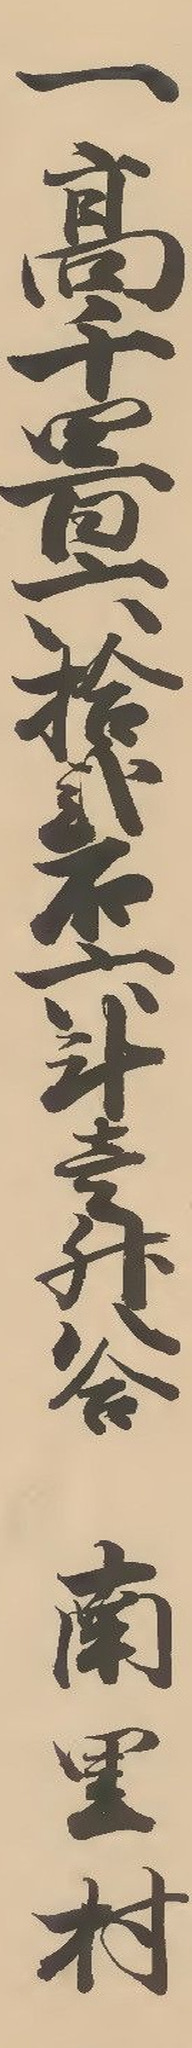一髙千四百六拾弐石六斗壱升八合南里村
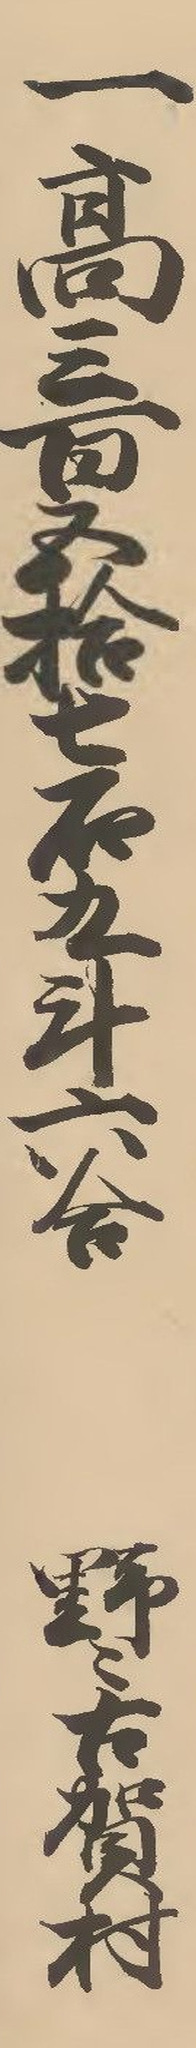一髙三百五拾七石九斗六合野々古賀村
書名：肥前国郷帳
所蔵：国立公文書館 National Archives of Japan
